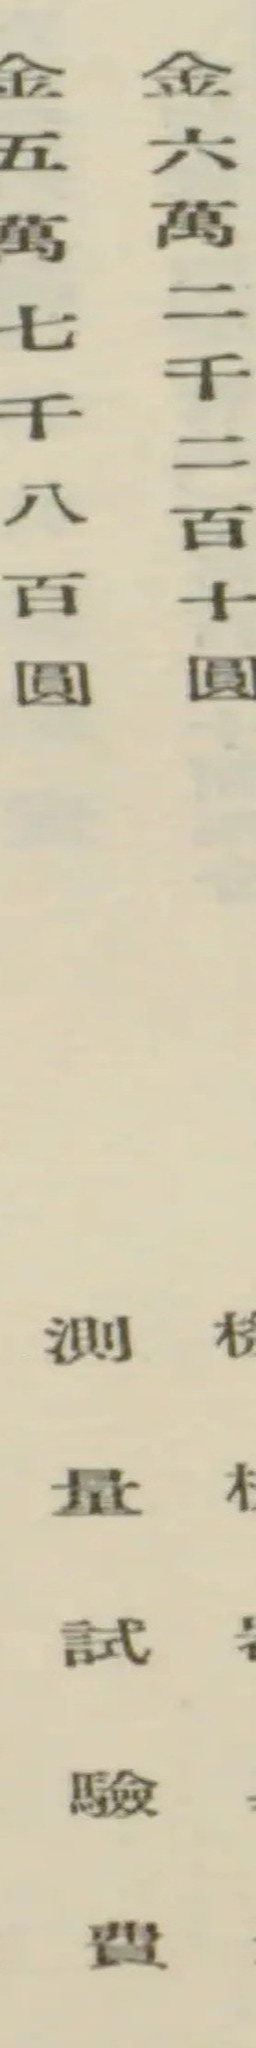金五萬七千八百円測量試験費
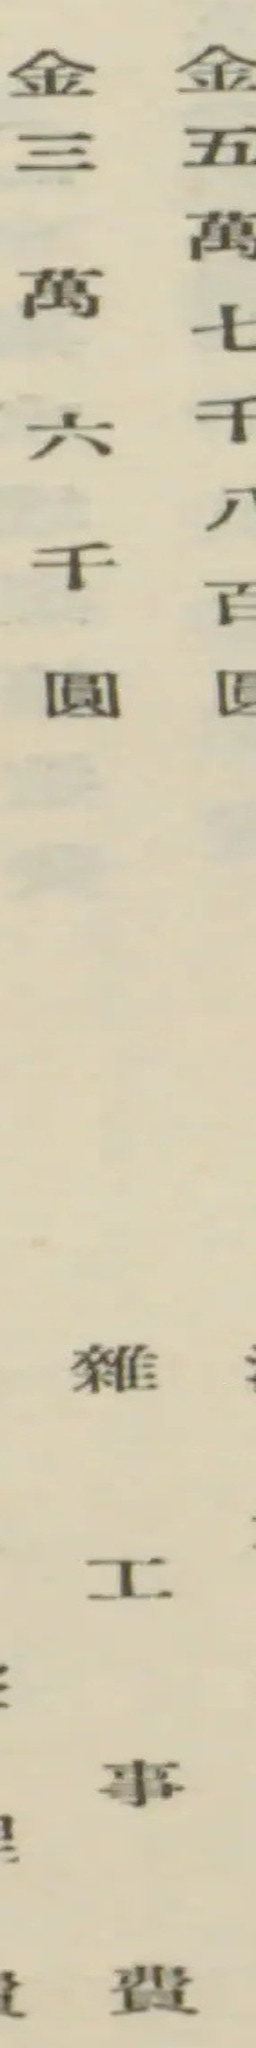金三萬六千円雑工事費
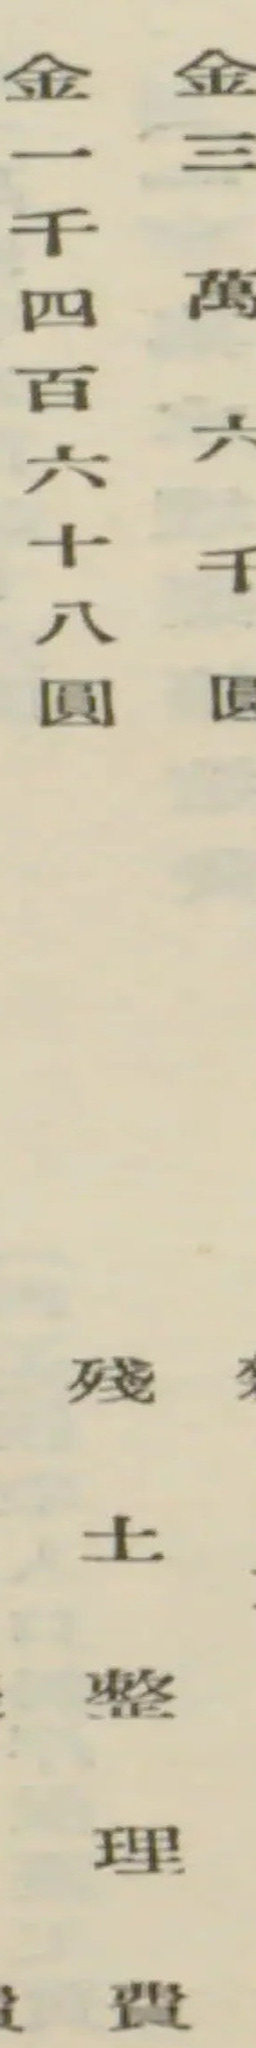金一千四百六十八円残土整理費
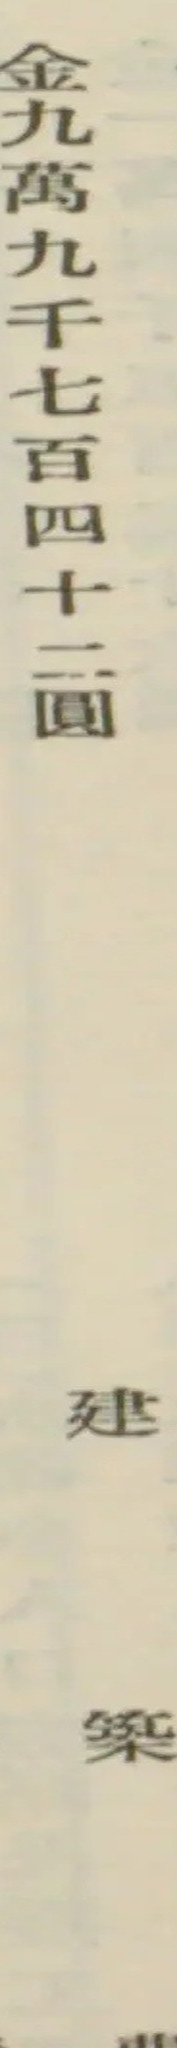金九萬九千七百四十二円建築費
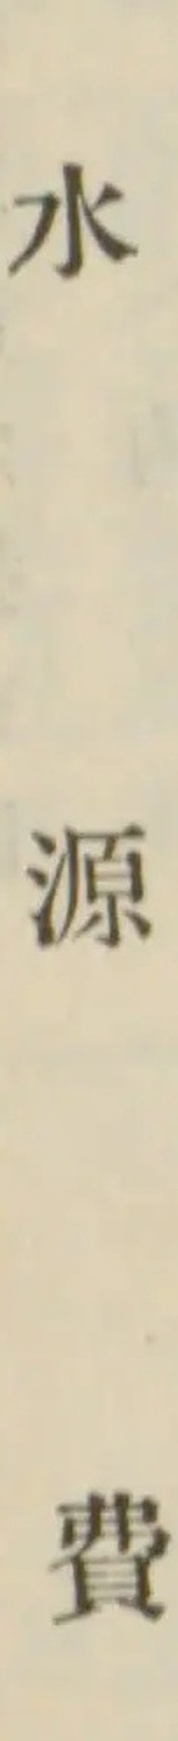水源費

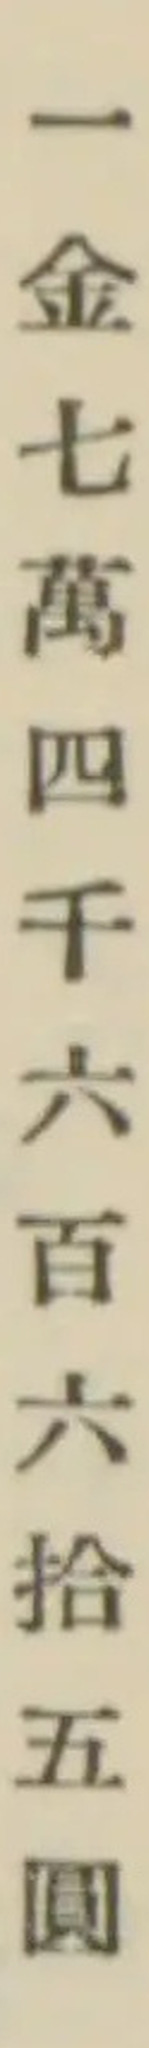一金七萬四千六百六拾五円
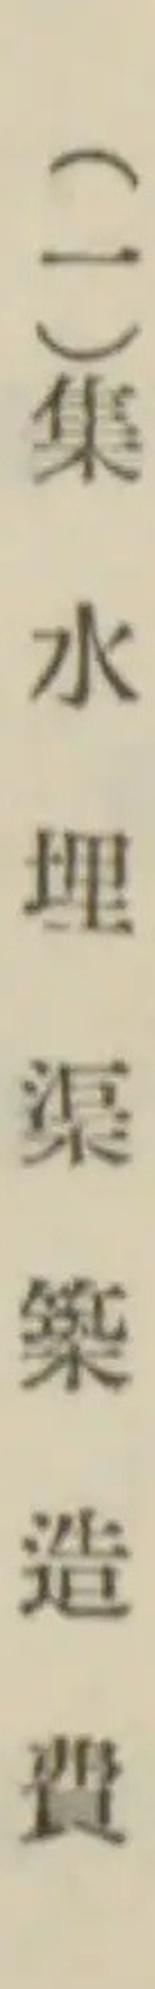(一)集水埋渠築造費
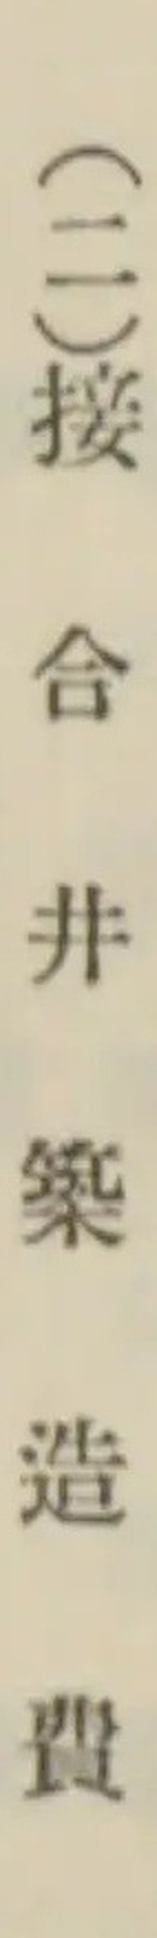(ニ)接合井築造費
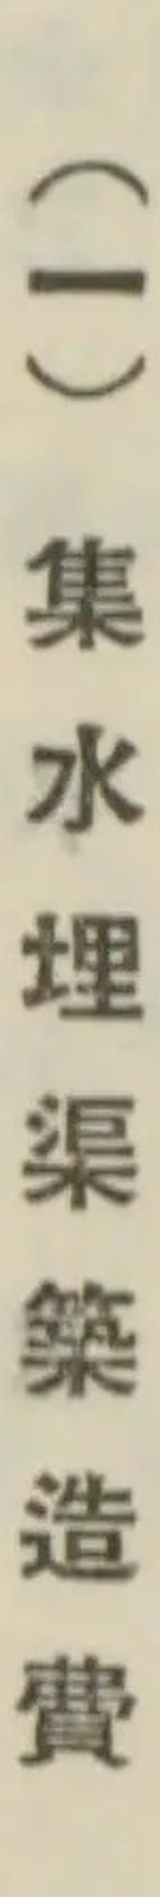(一)集水埋渠築造費
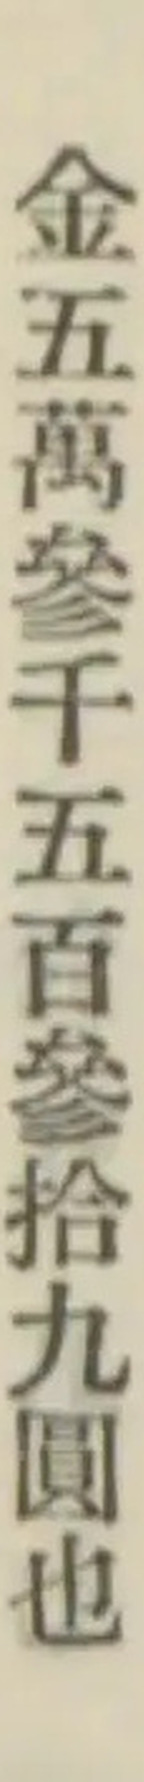金五萬参千五百参拾九円也
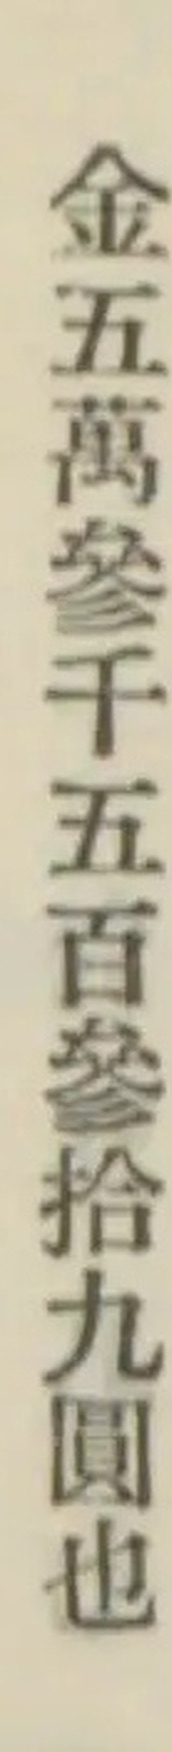金五萬参千五百参拾九円也
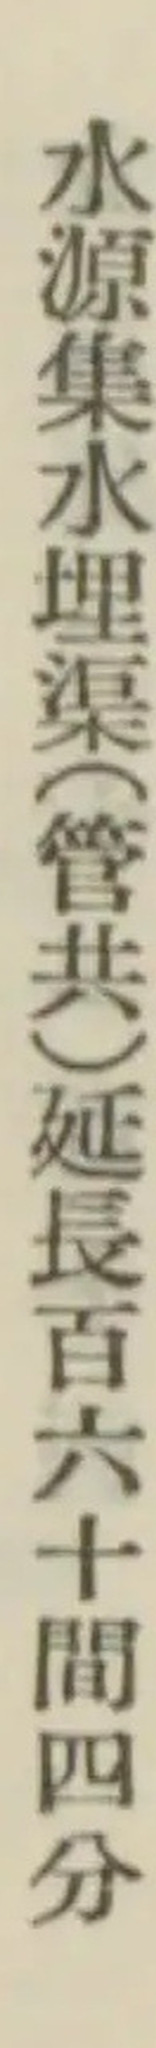水源集水埋渠(管供)延長百六十間四分
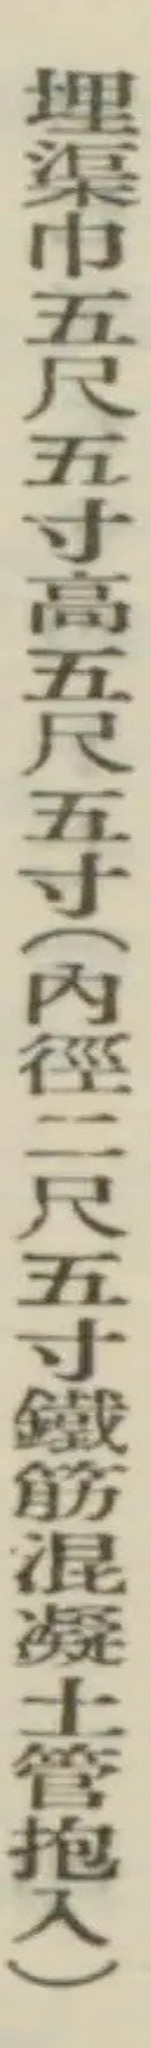埋渠巾五尺五寸高五尺五寸(内径二尺五寸鉄筋混凝土管抱入)
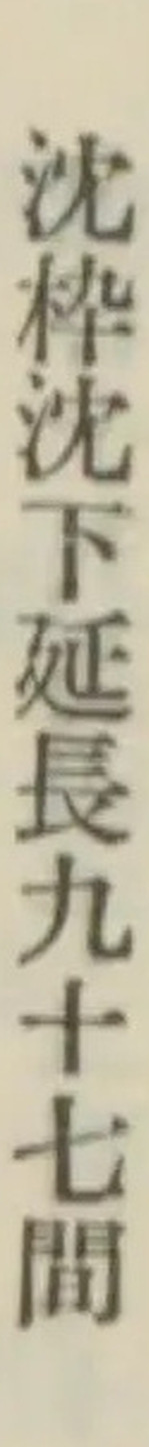沈枠沈下延長九十七間
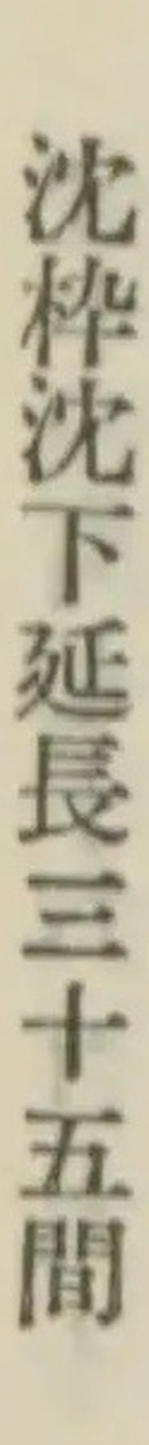沈枠沈下延長三十五間
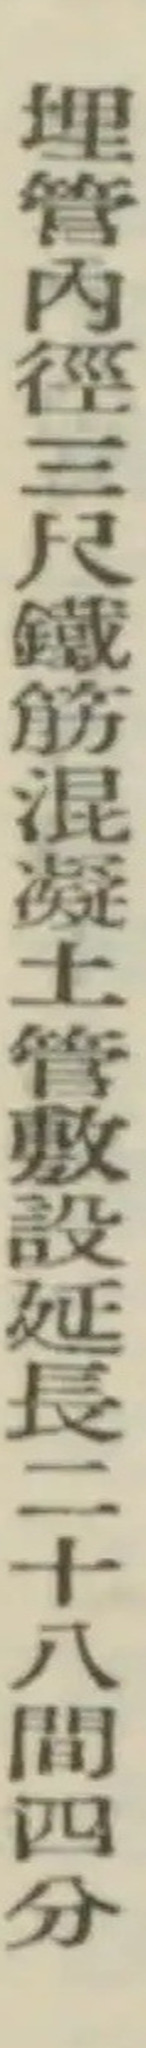埋管内径三尺鉄筋混凝土管敷設延長二十八間四分
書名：豊橋市水道誌
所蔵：国立国会図書館 National Diet Library, JAPAN
